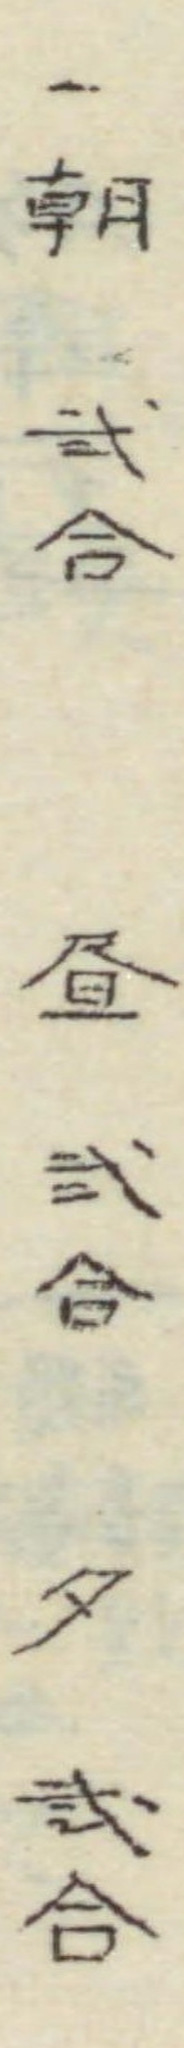一朝弐合昼二合夕二合
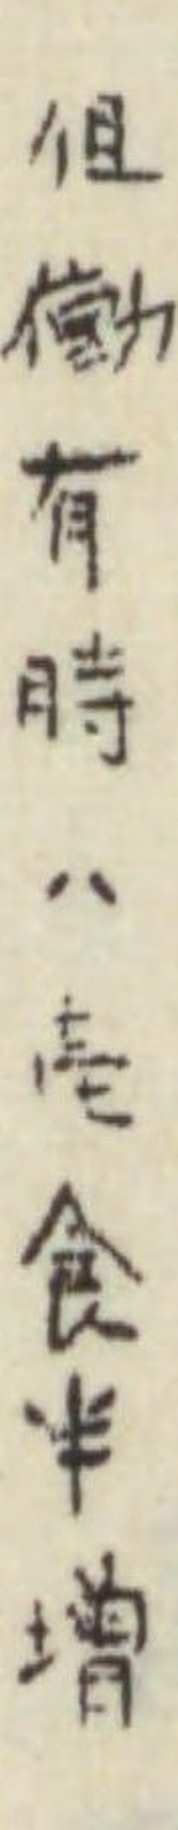但働有時ハ壱食半増
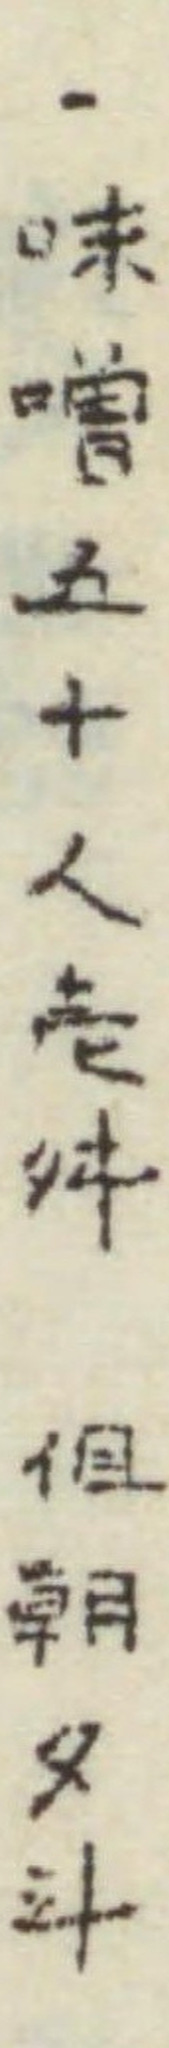一味噌五十人壱升但朝夕斗
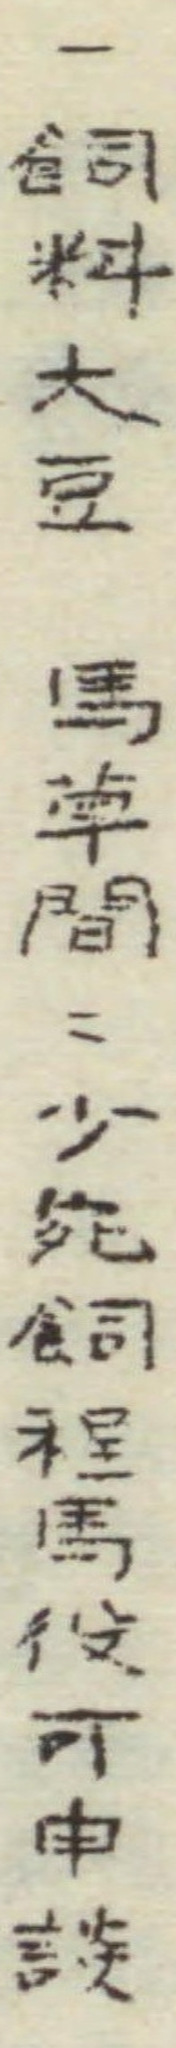一飼料大豆馬草間二少宛飼宛程馬役可申談
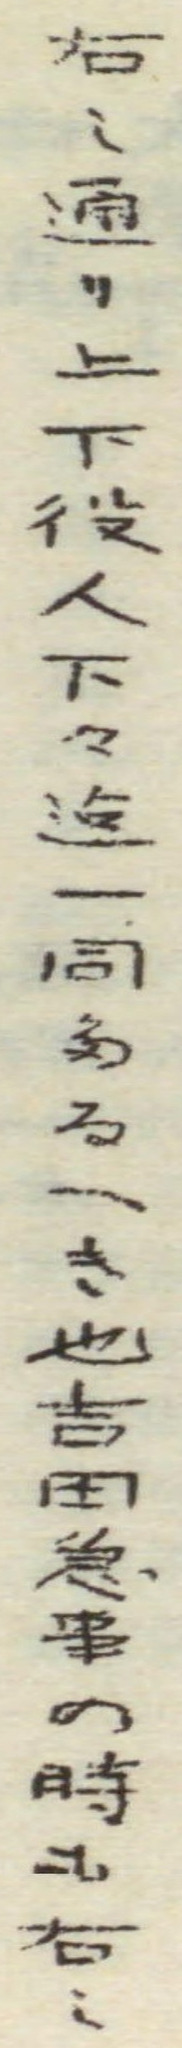右之通り上下役人下々迄一同たるへき也吉田急事も右之
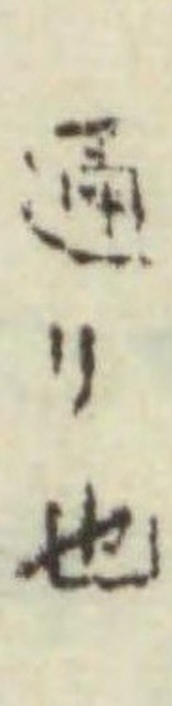通り也
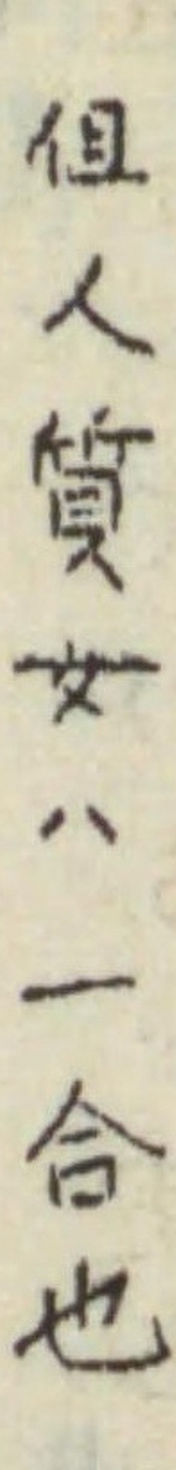但人質女ハ一合也

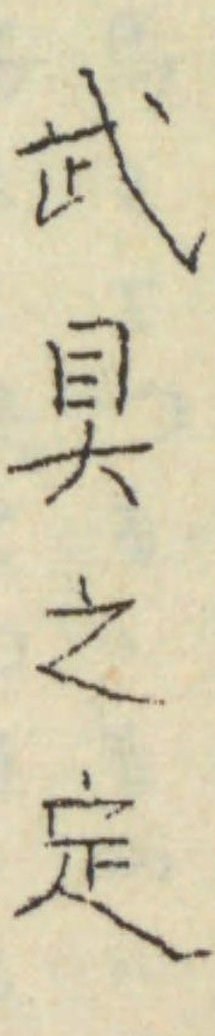武具之定
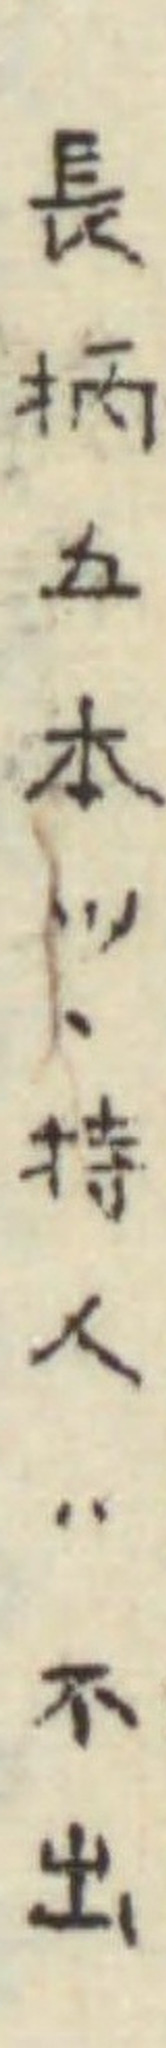長柄五本ツゝ持人ハ不出
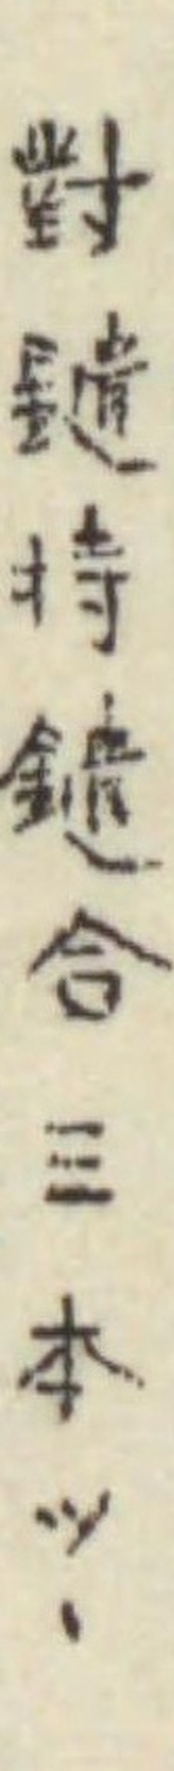対鑓持鑓合三本ツゝ
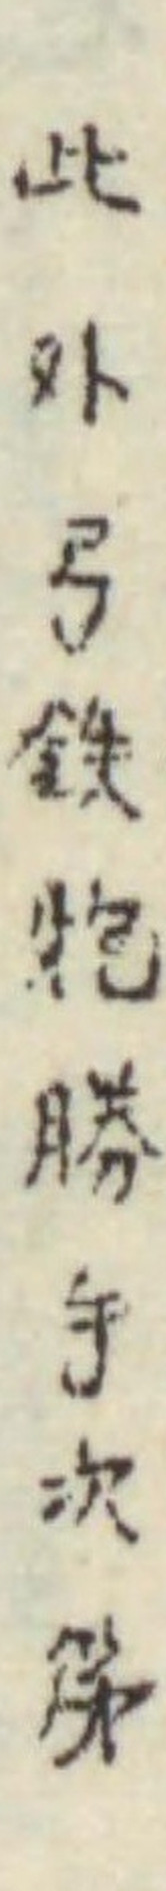此外弓鉄炮勝手次第
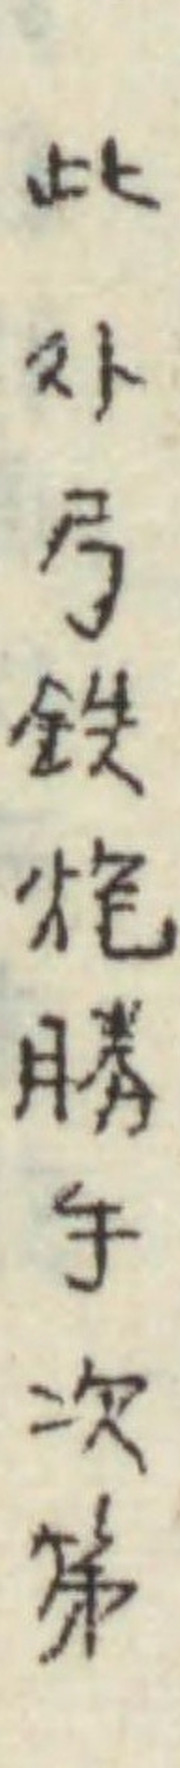此外弓鉄炮勝手次第
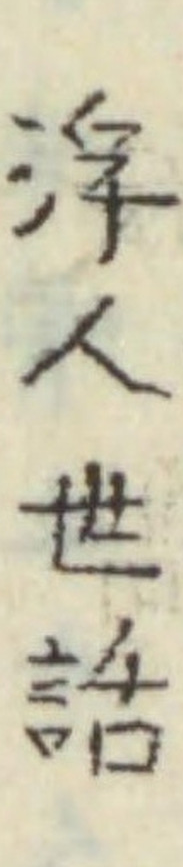浮人世話
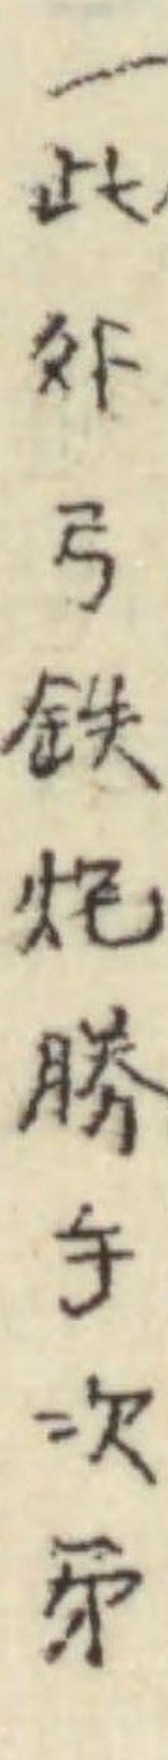此外弓鉄炮勝手次第
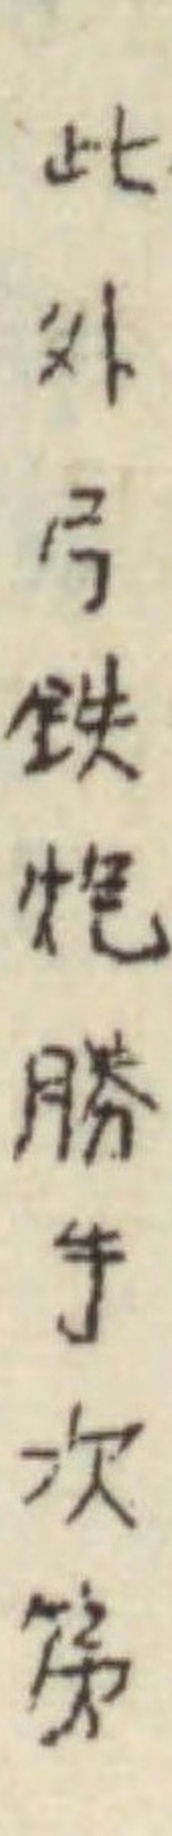此外弓鉄炮勝手次第
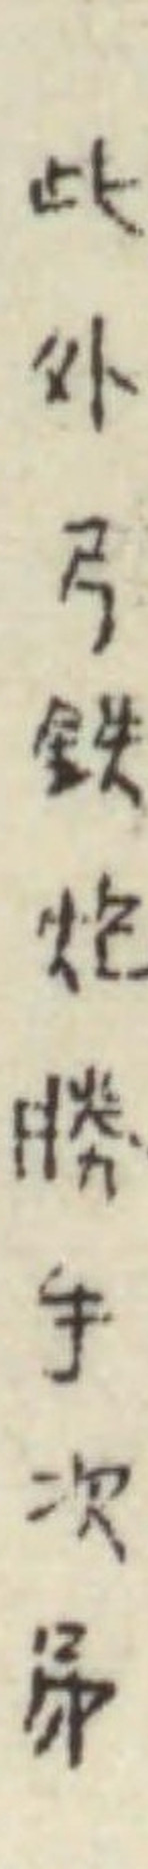此外弓鉄炮勝手次第
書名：三河吉田藩動員史料
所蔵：国立国会図書館 National Diet Library, JAPAN
